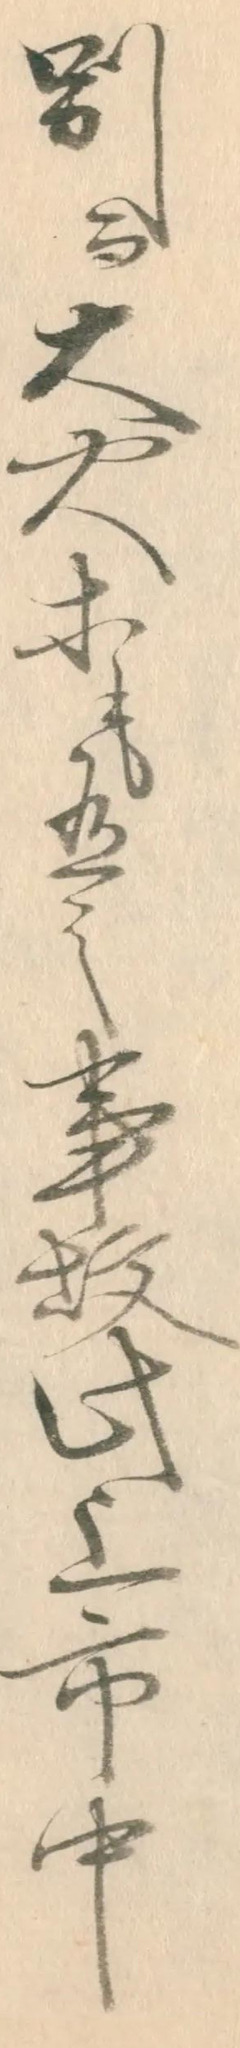別而大火等も有之事故此上市中
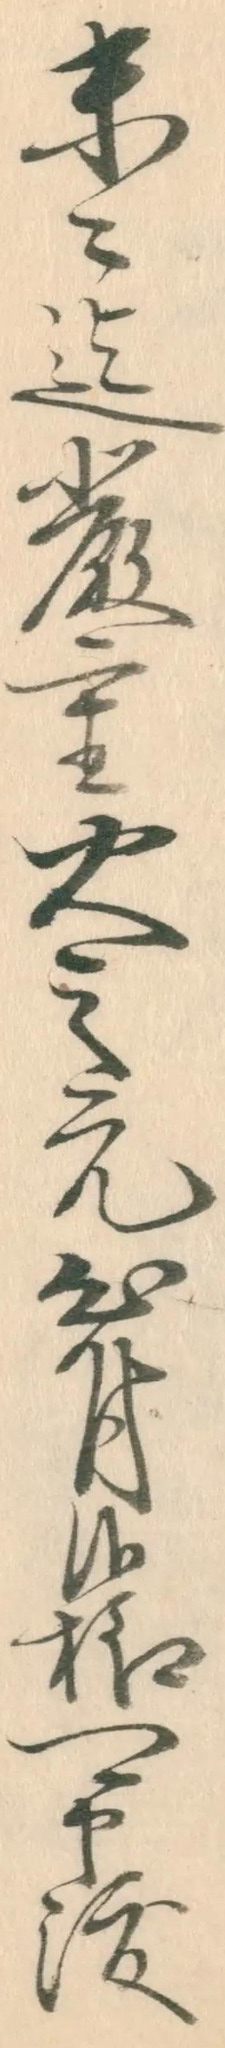末々迄厳重火之元心付候様可申渡
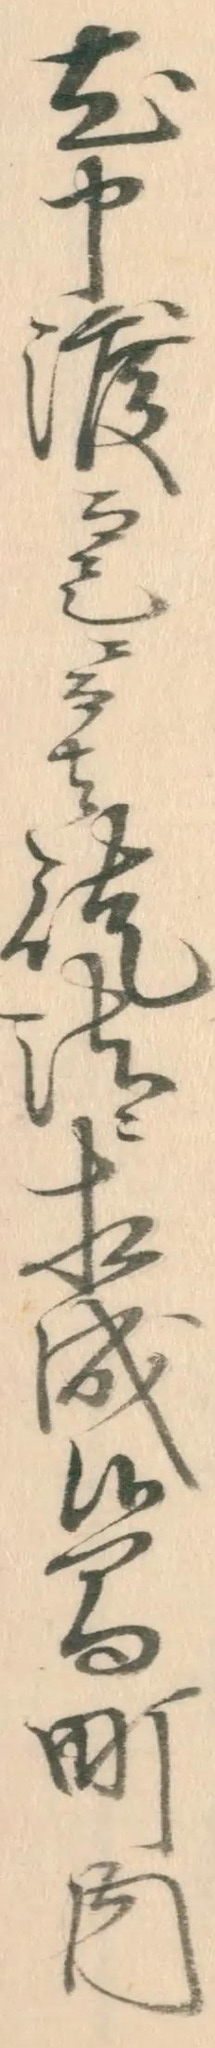尤申渡而已ニ而は徒法ニ相成候間町内
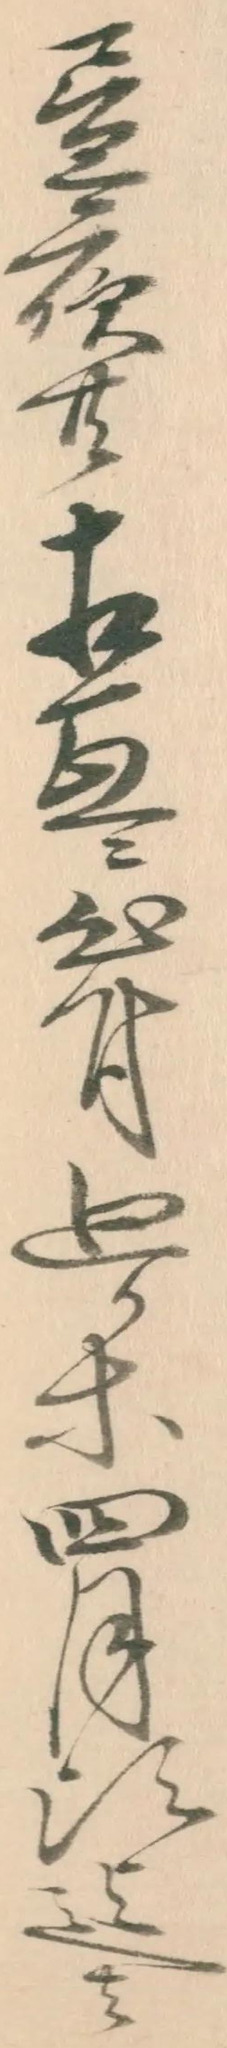昼夜共相互ニ心付廻り等四月頃迄は
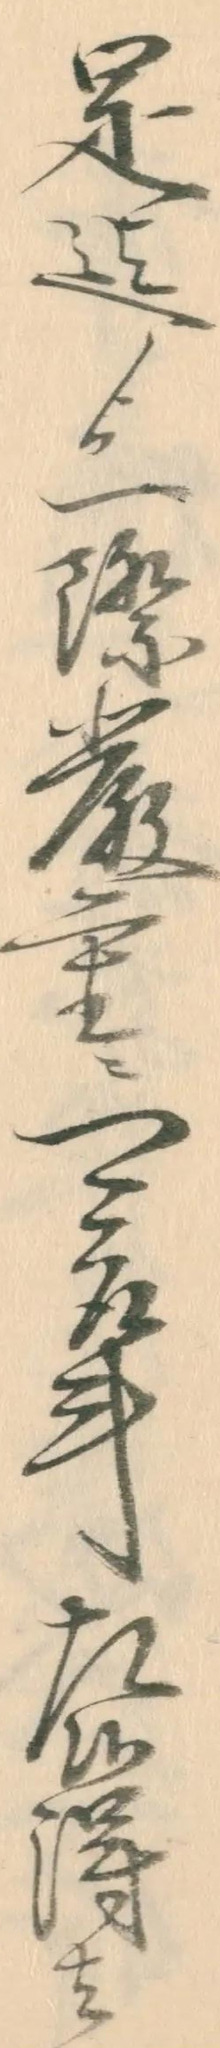是迄ゟ一際厳重ニ可取計左候得は
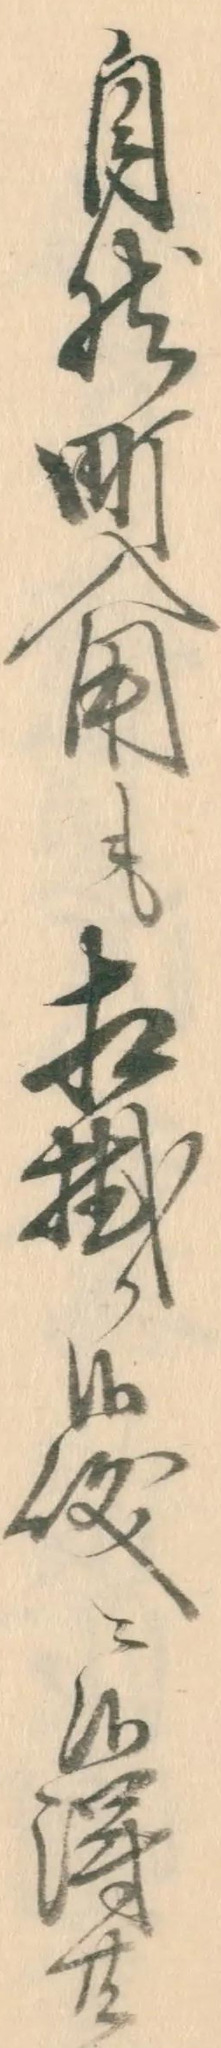自然町入用も相掛り候儀ニ候得共
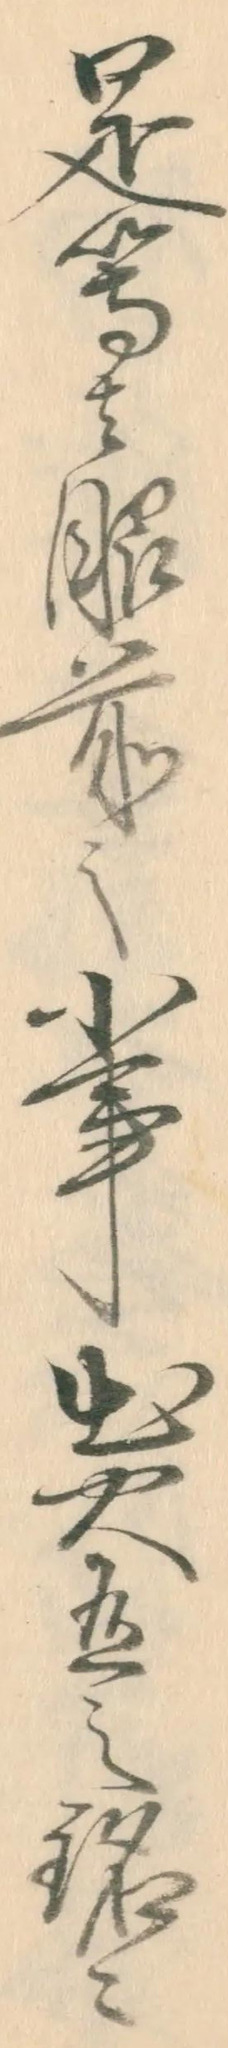是等は脇前之小事出火有之銘々
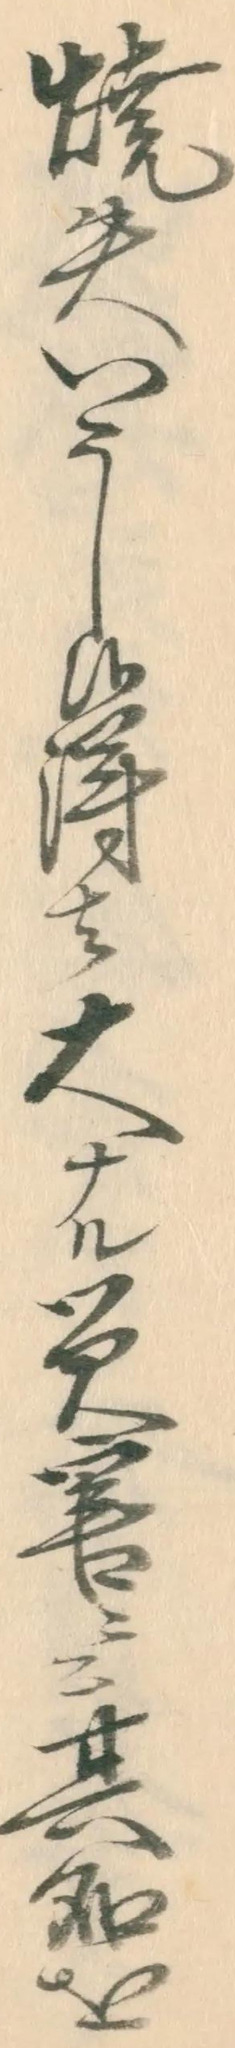焼失いたし候得は大ナル災害ニ而其処を
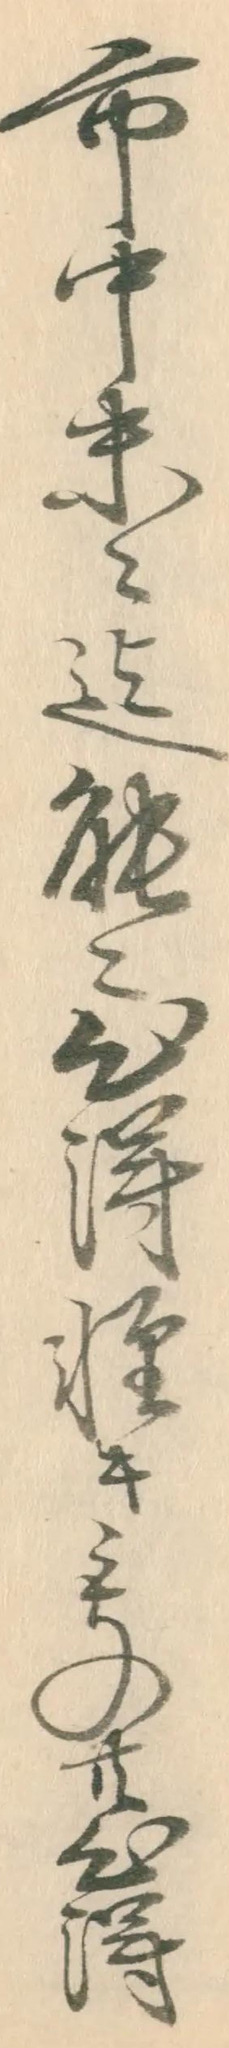市中末々迄能々心得軽キもの共心得
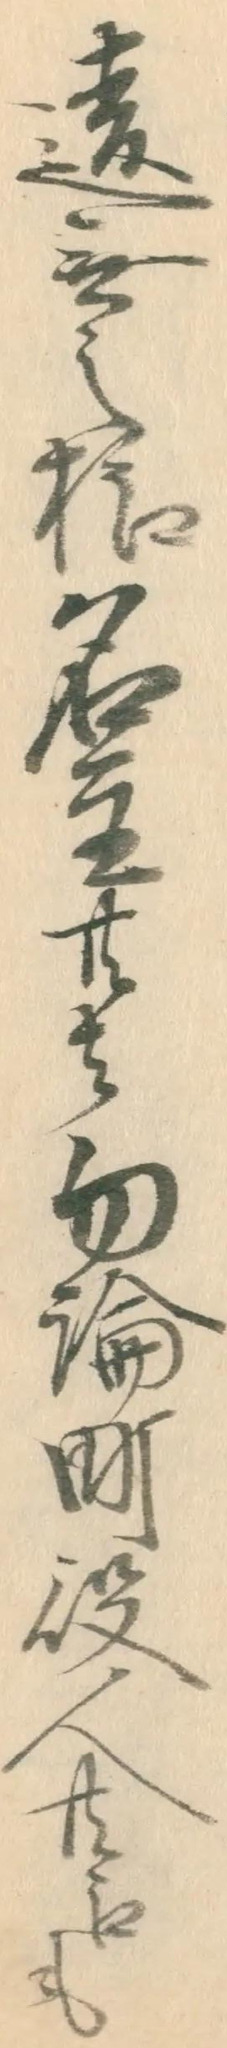違無之様名主共は勿論町役人共えも

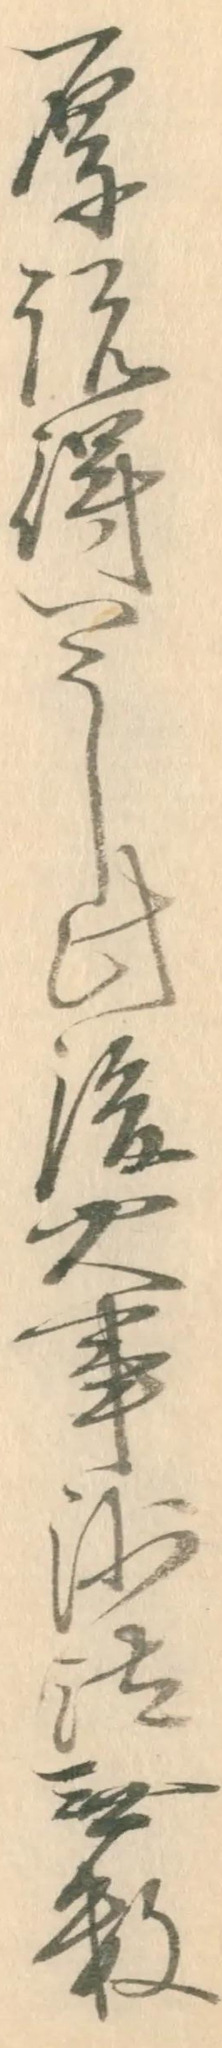厚説得いたし此後火事沙汰無数
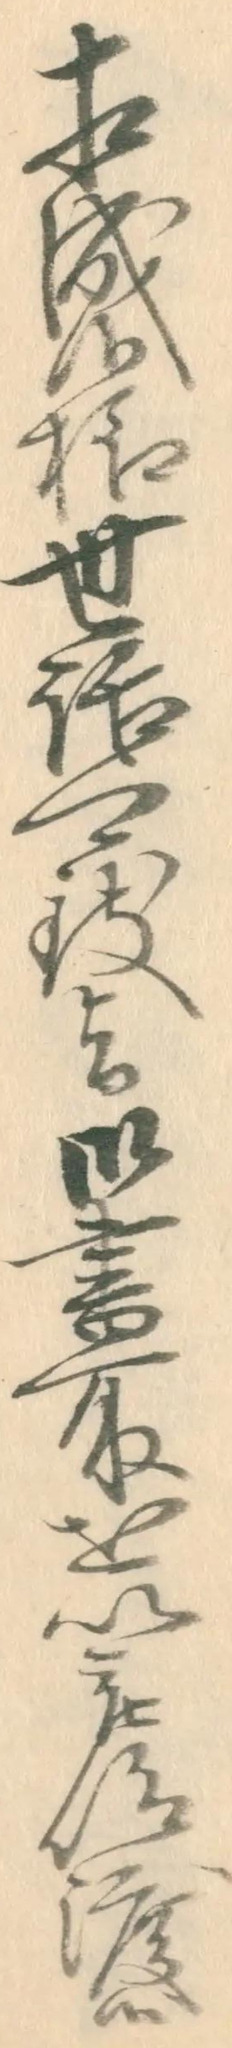相成候様世話可致旨御書取を以被仰渡候
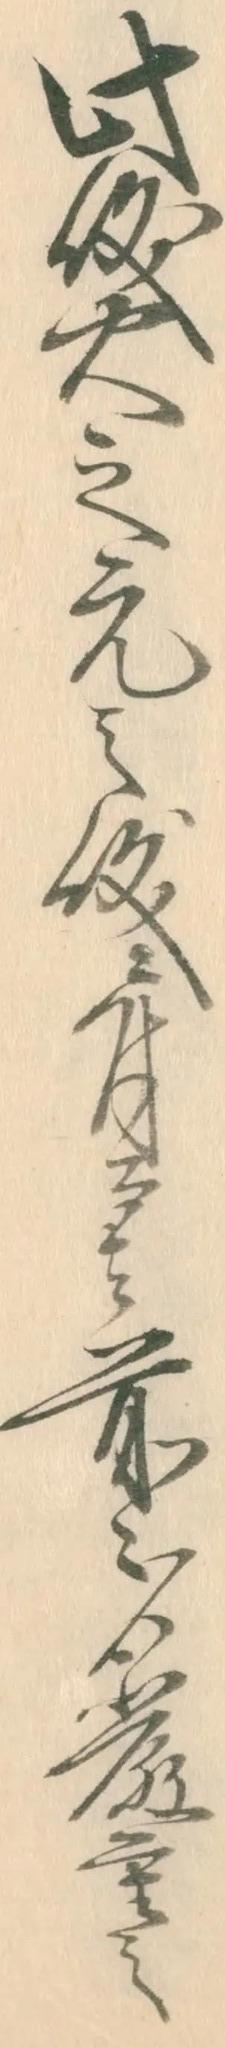此儀火之元之儀ニ付而は前々ゟ厳重之
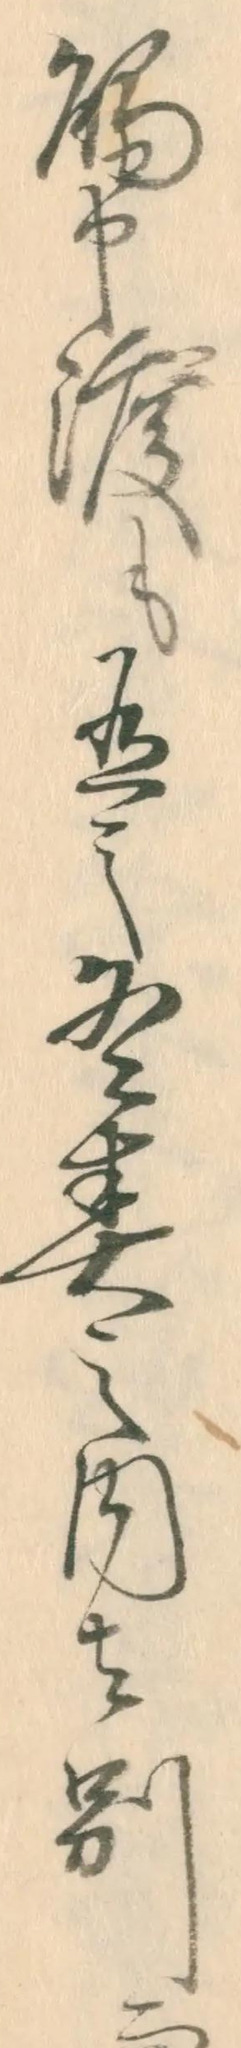触申渡も有之冬春之内は別而
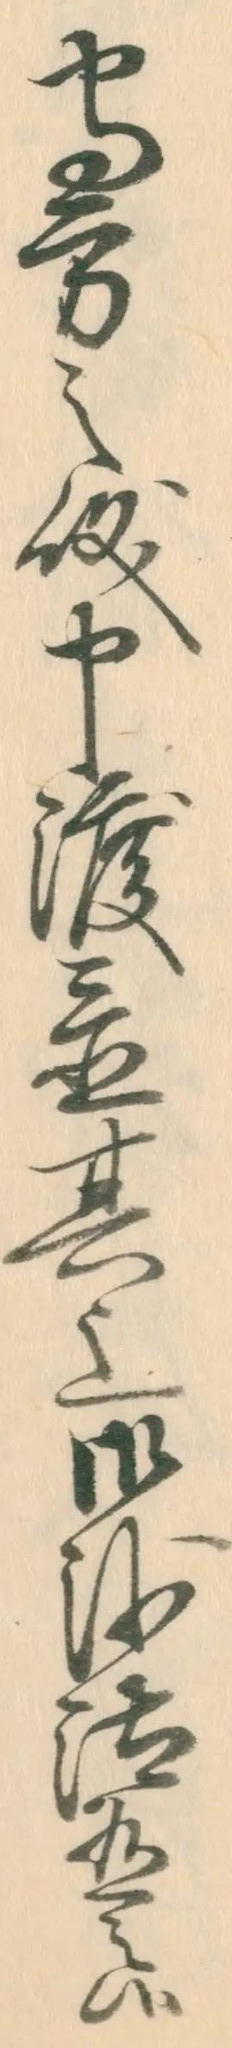守方之儀申渡置其上御沙汰有之候
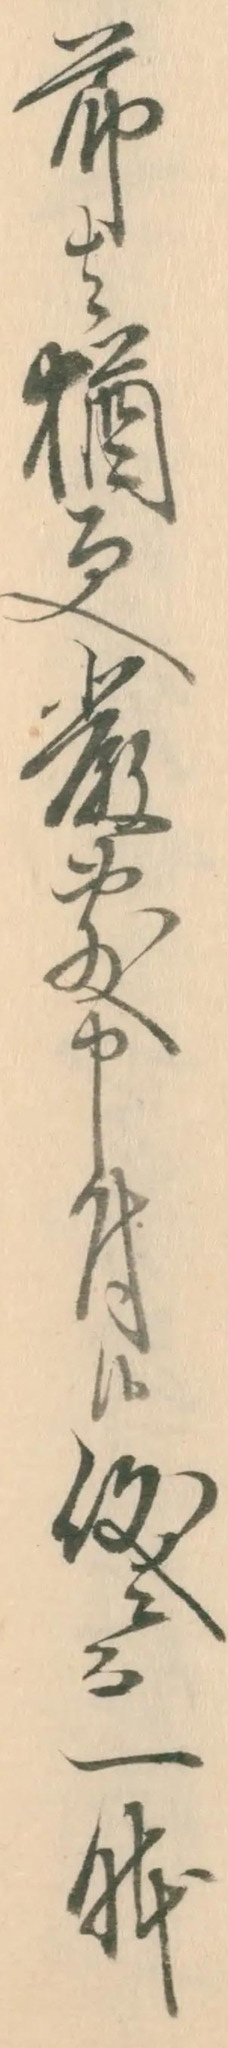節は猶更厳敷申付候儀ニ而一体
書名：三橋 17巻. [7] 三橋小破御修復書留　但御奉行御掛リ替地震潰橋番屋　嘉永四亥年より安政二卯年迄　上
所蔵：国立国会図書館 National Diet Library, JAPAN
